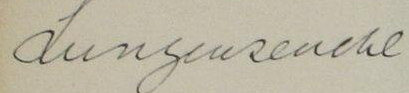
Lungenseuche
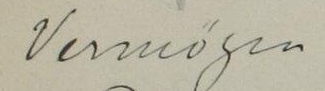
Vermögen
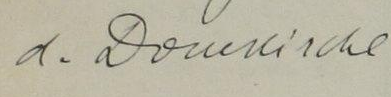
d. Domkirche
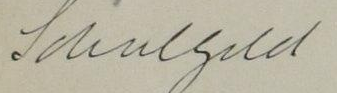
Schulgeld
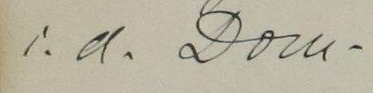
i. d. Dom
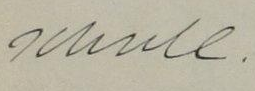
schule
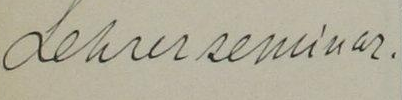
Lehrerseminar
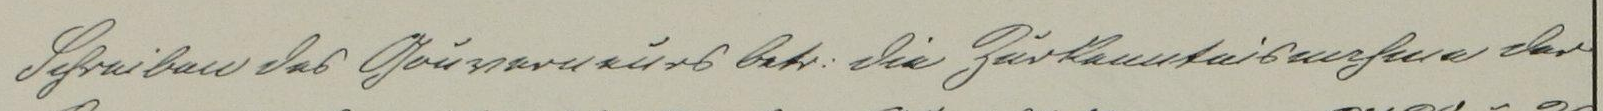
Schreiben des Gouverneurs betr. die Zurkenntnisnahme der
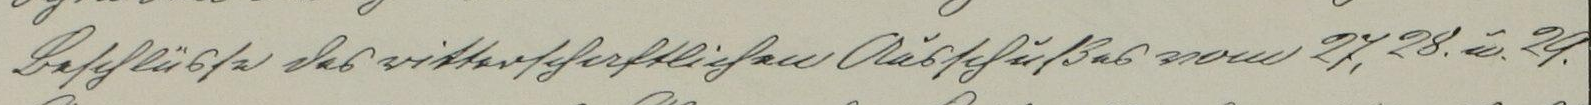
Beschlüsse des ritterschaftlichen Ausschußes vom 27, 28. u. 29.
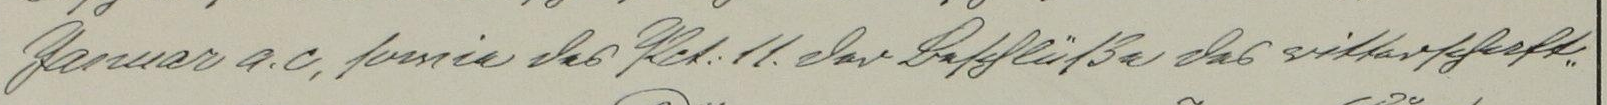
Januar a.c, sowie des Pct. 11 der Beschlüße des ritterschaft-
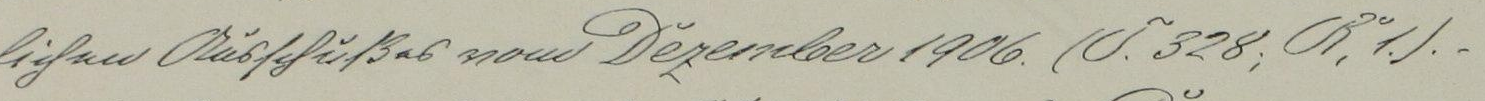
lichen Ausschußes vom Dezember 1906. (T.328; R.1).
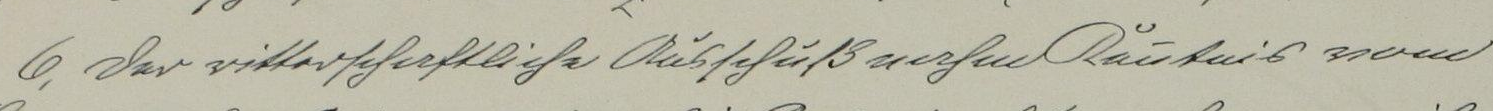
6. Der ritterschaftliche Ausschuß nahm Kenntnis vom
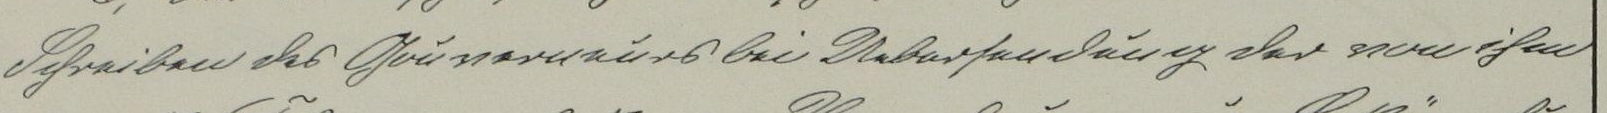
Schreiben des Gouverneurs bei Uebersendung der von ihm
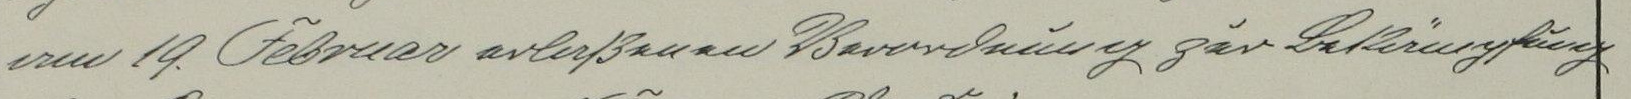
am 19. Februar erlaßenen Verordnung zur Bekämpfung
